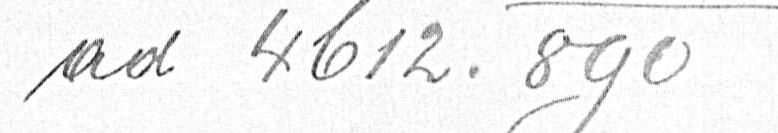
ad 4612. 890
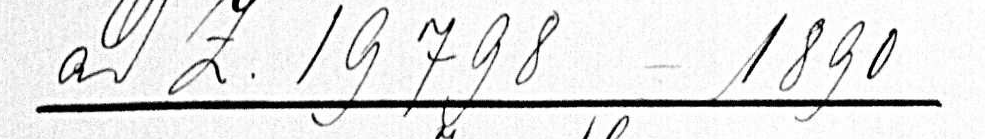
ad Z. 19798 - 1890
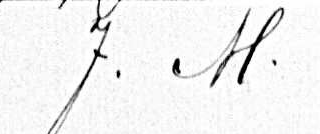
Jch überlasse Meinem
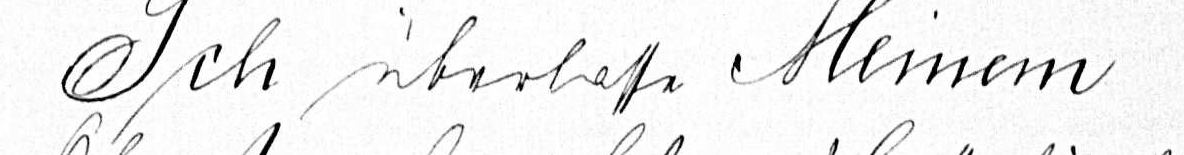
Ich überbese Meinem
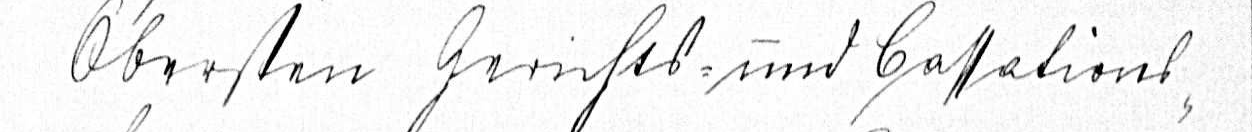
Obersten Gerichts- und Cassations¬
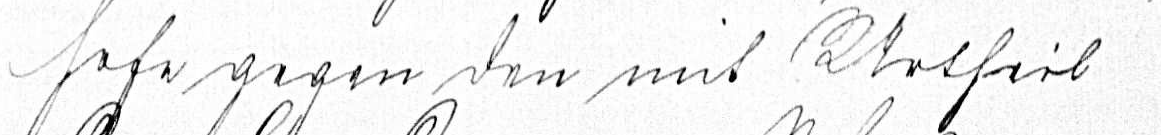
fehr gegen den mit Urtheil
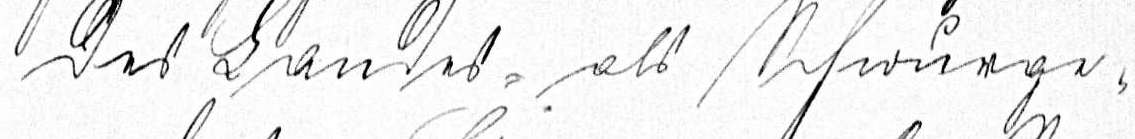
Des Landes- als Schwurge¬
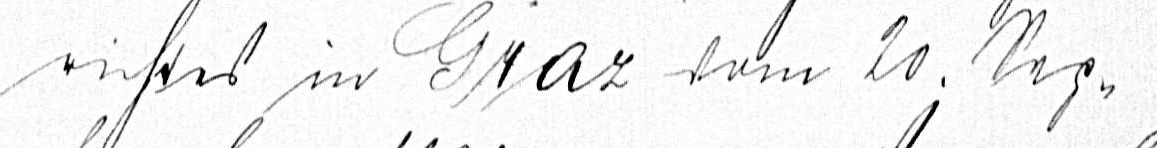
richtes in Granz vom 20. Sep¬
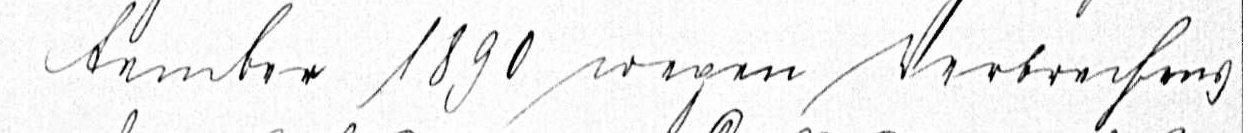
tember 1890 wegen Verbrechens
